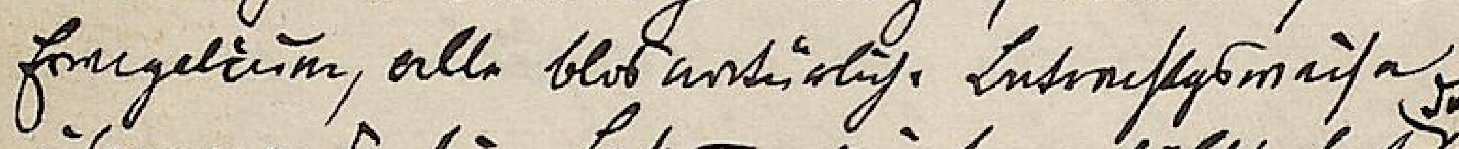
Evangeliun, alle blos natürliche Betrachtungsweise
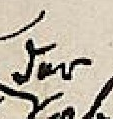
der
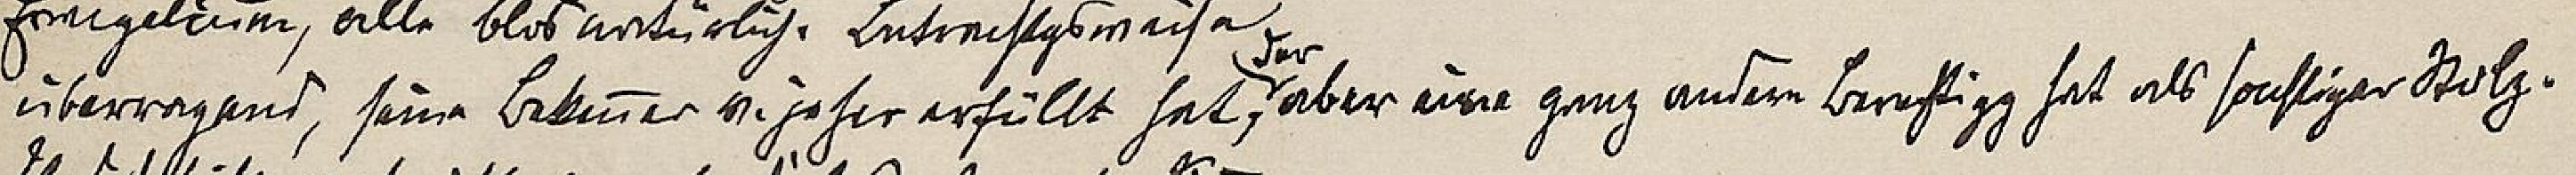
überragend, seine Bekener v. jeher erfüllt hat, aber eine ganz andere Berechtigg hat als solchiger Stolz.
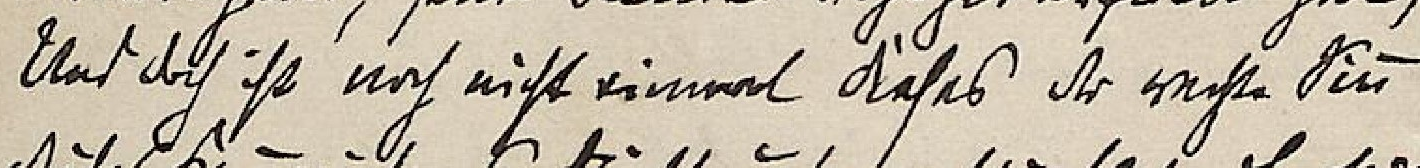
Und das ist noch nicht einmal dieses der rechte Sin
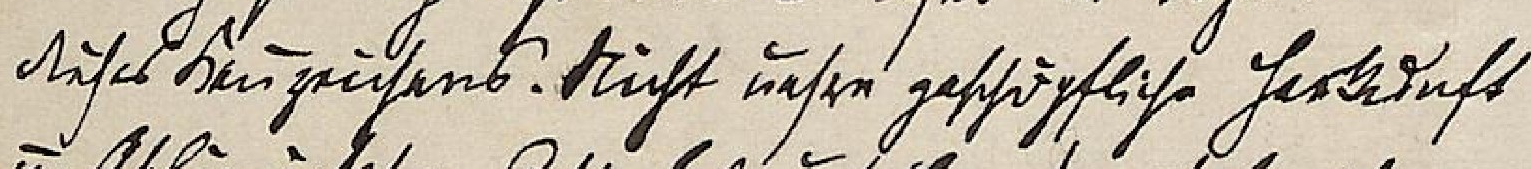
dieses Kenzeichens. Nicht unsre geschöpfliche Herkunft
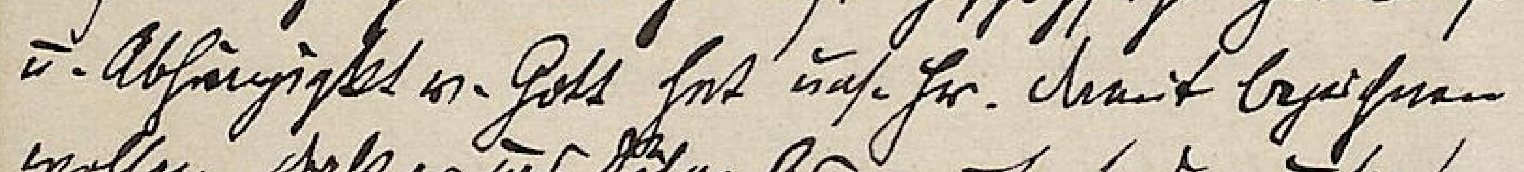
u. Abhängigkt v. Gott hat unsr Hr. damit bezeichnen
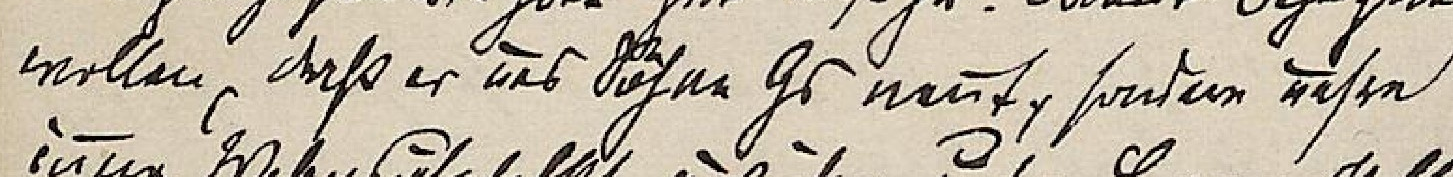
wollen, daß er uns Söhne Gs nent, sondern unsre
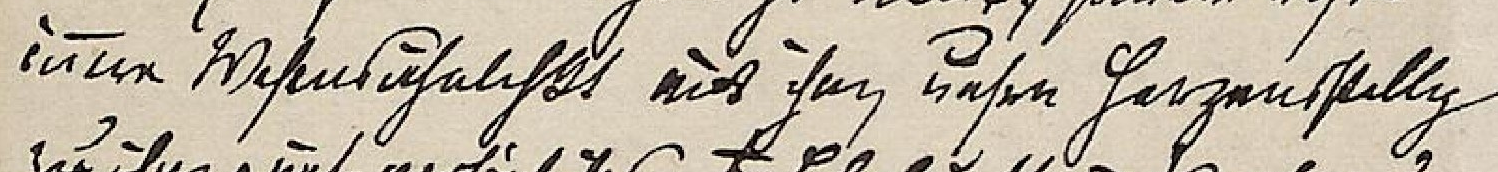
innere Wesensähnlichkt mit ihm, unsere Herzensstellg.
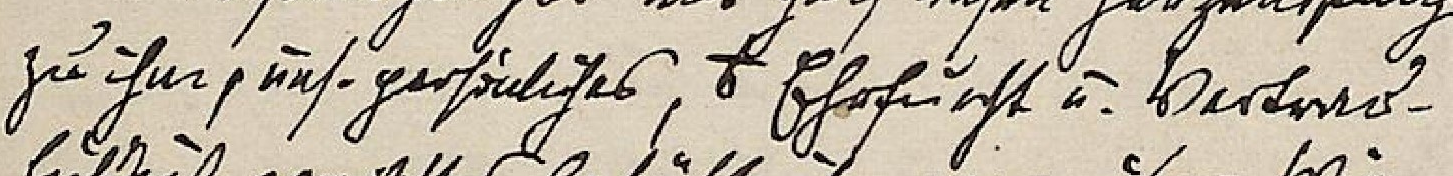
zu ihm, uns. persönliches, s Ehrfurcht u. Vertrau¬
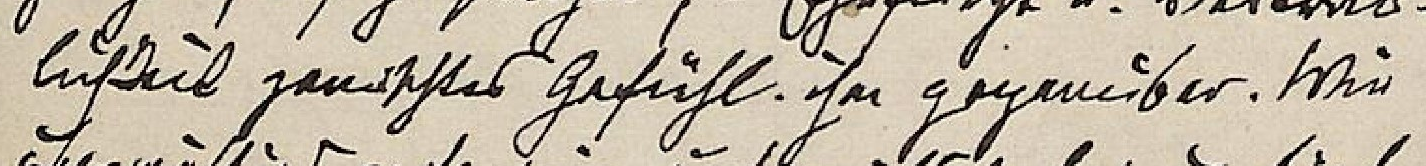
lichkeit gemischtes Gefühl. ihm gegenüber. Wie
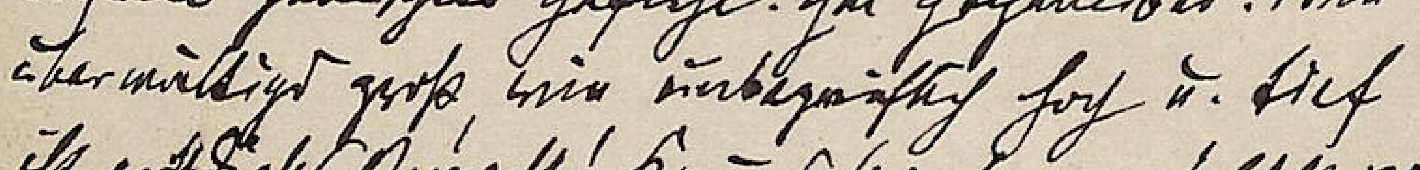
überwältigd. groß, wie unbegreiflich hoch u. tief
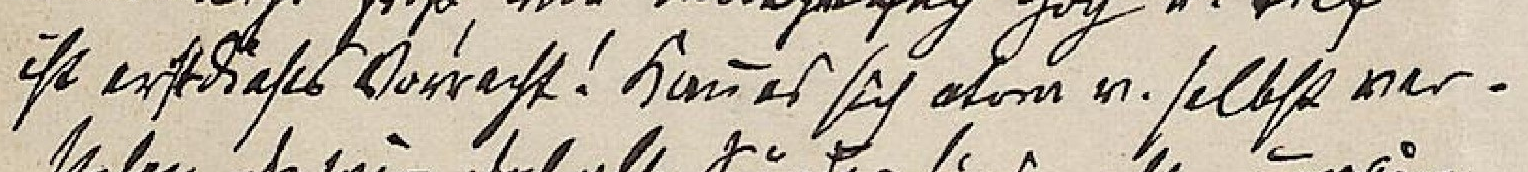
ist er ist dieses Vorrecht! Kan es sich etwa v. selbst ver¬
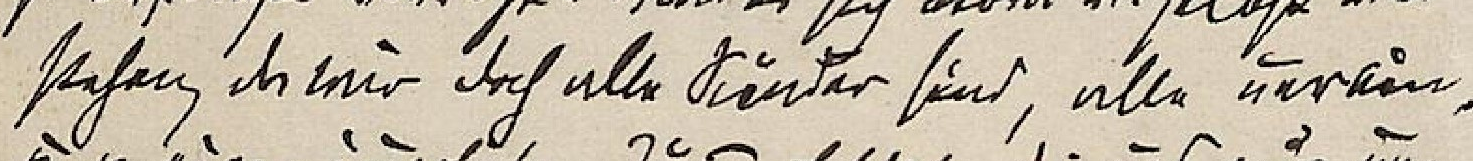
stehen, da wir doch alle Sünder sind. alle unrein
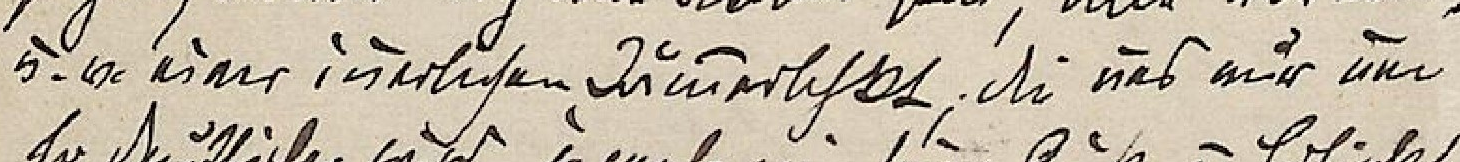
u. v. einer inerlichen Jämerlichkt, die uns nur um
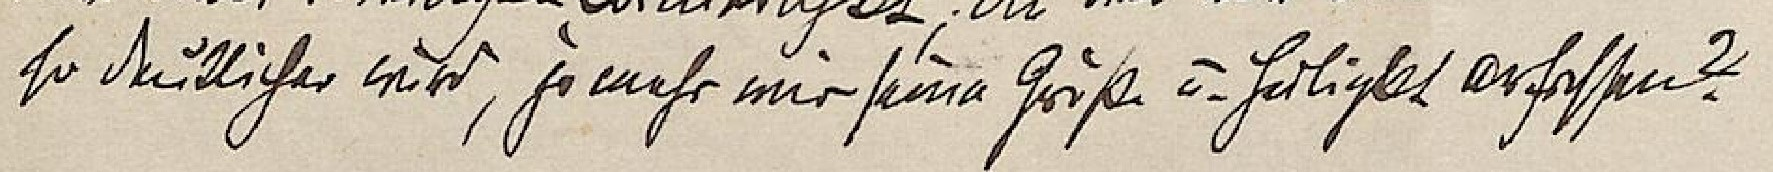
so deutlicher wird, je mehr wir seine Größe u. Heiligkt erfassen?
